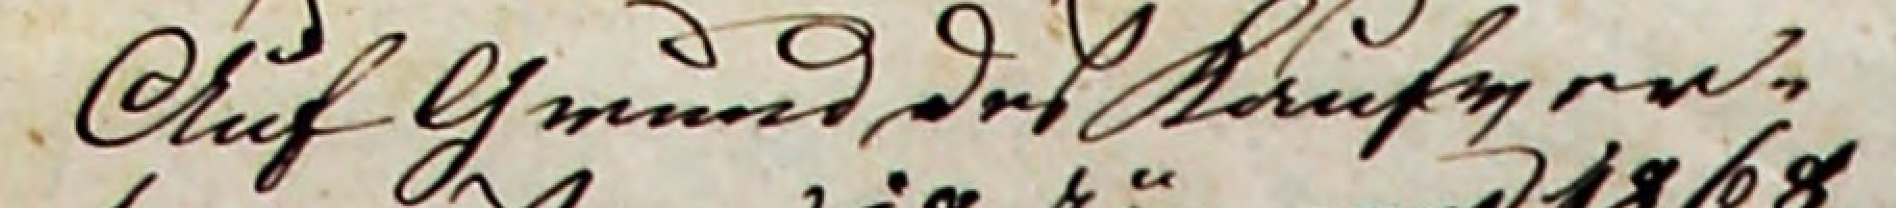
Auf Grund des Kaufver„
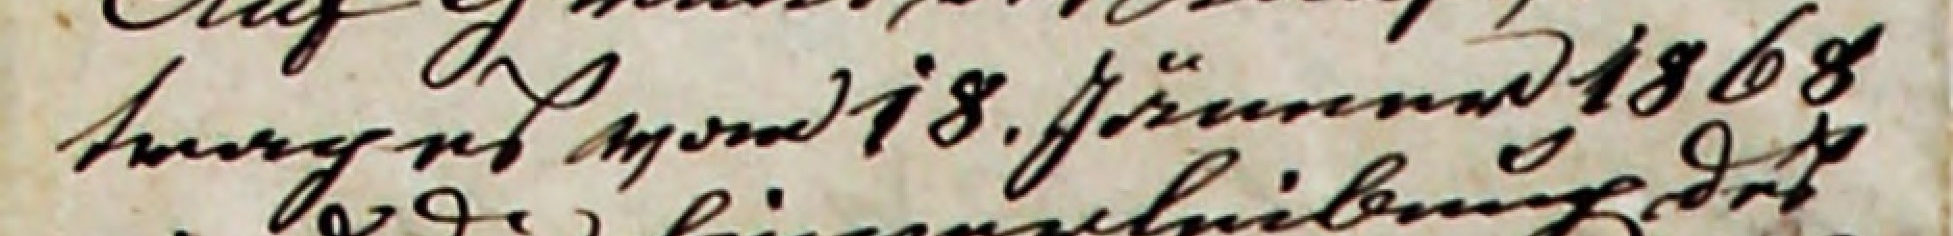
trages vom 18. Jänner 1868
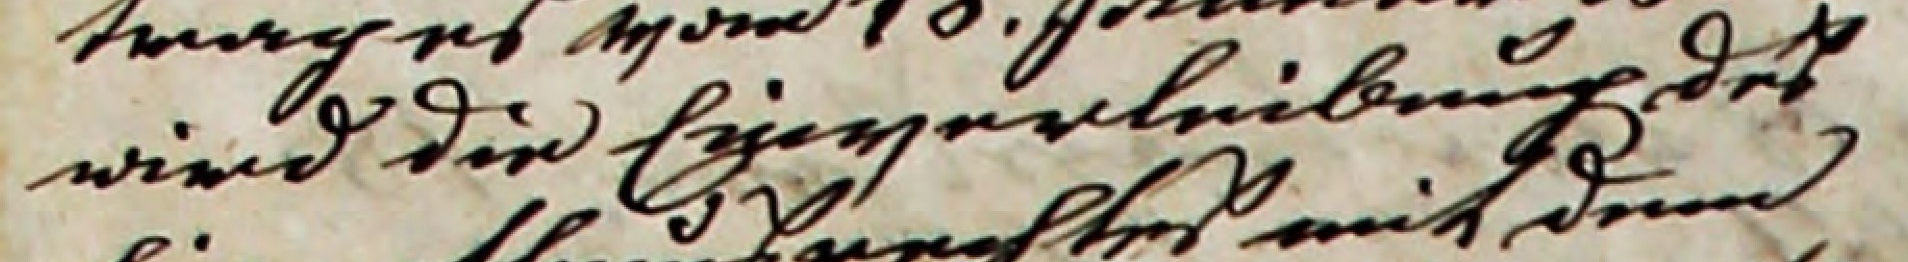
wird die Einverleibung des
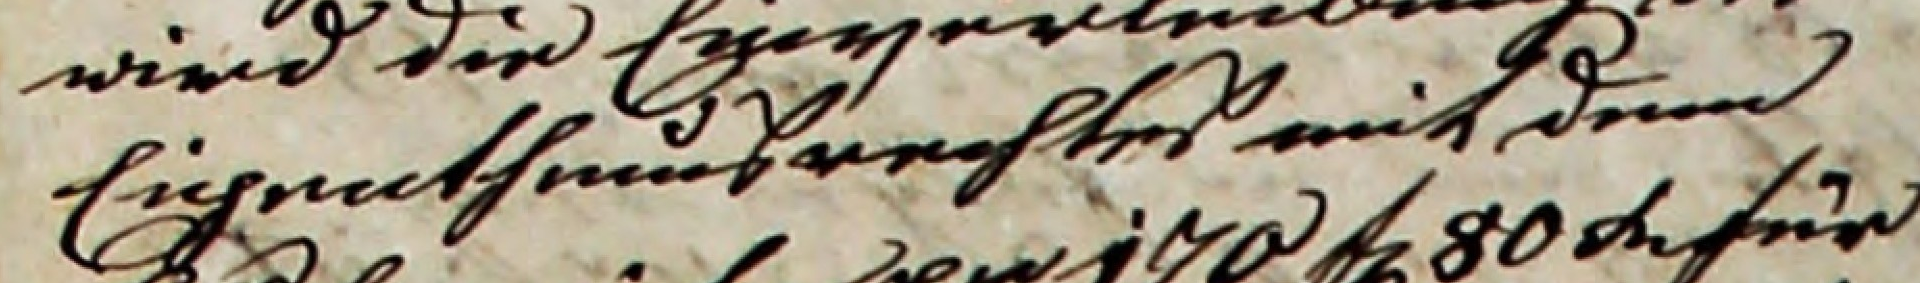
Eigenthumsrechtes mit dem
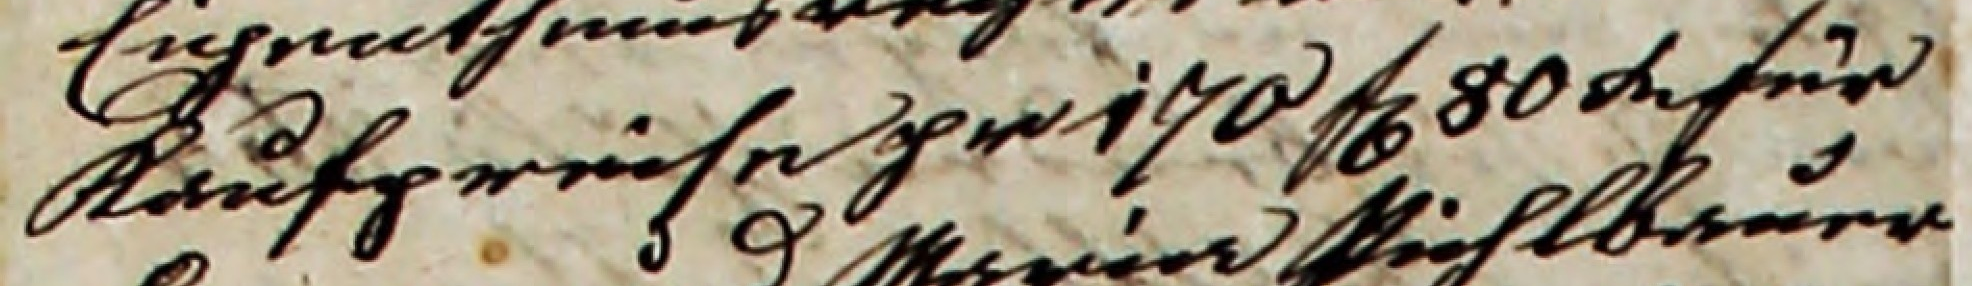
Kaufprüche pr 170 fl 80 defür
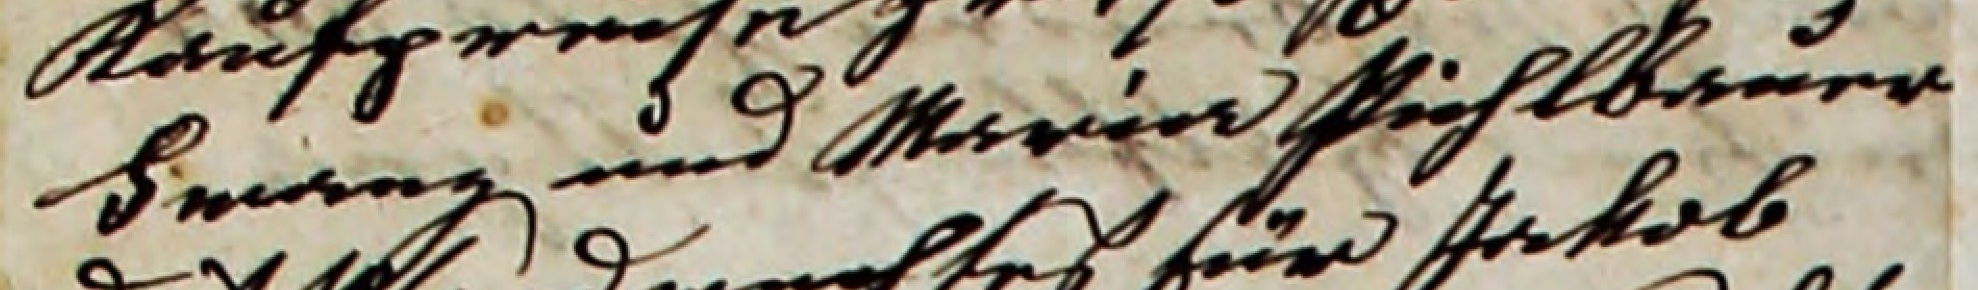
Swanz und Maria Pichlbauer
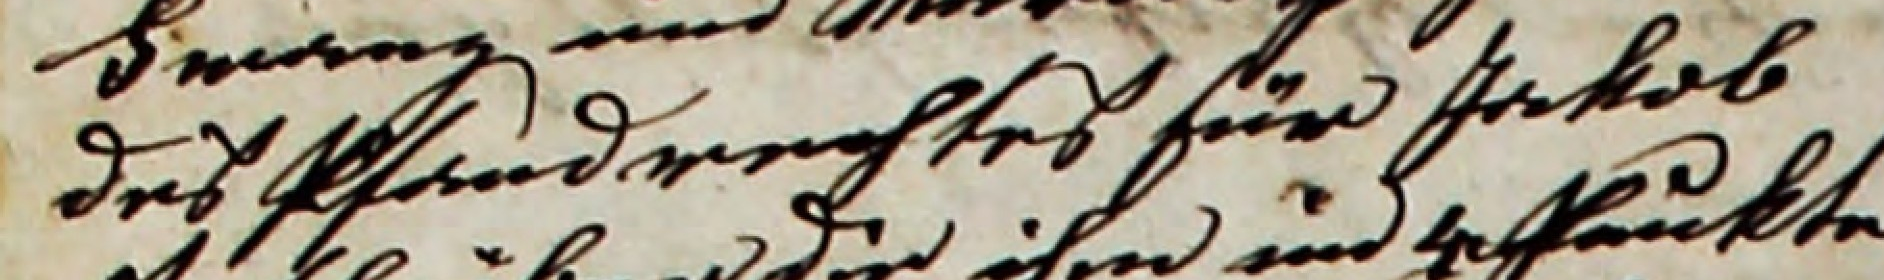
des Pfandrechtes für Jakob
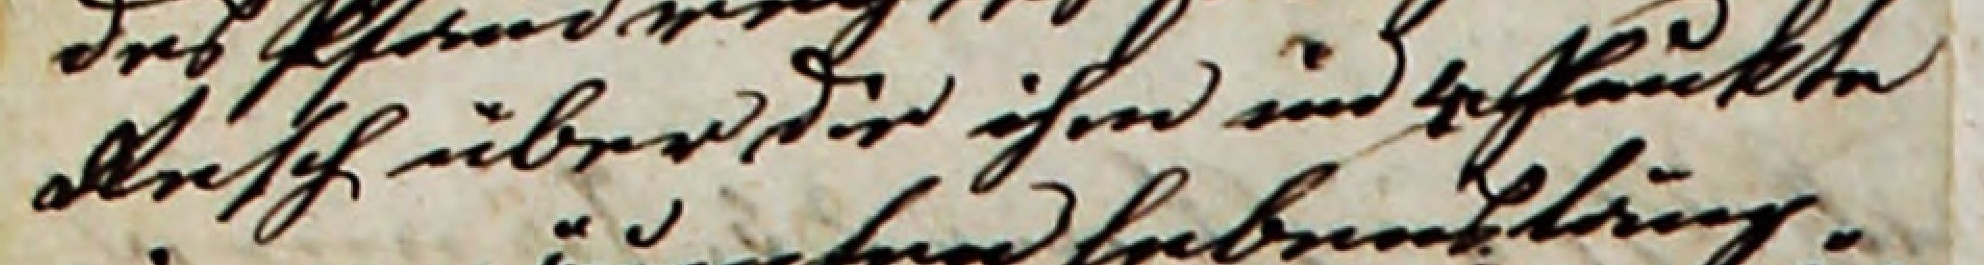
Resch über die ihm im 4 Paukte
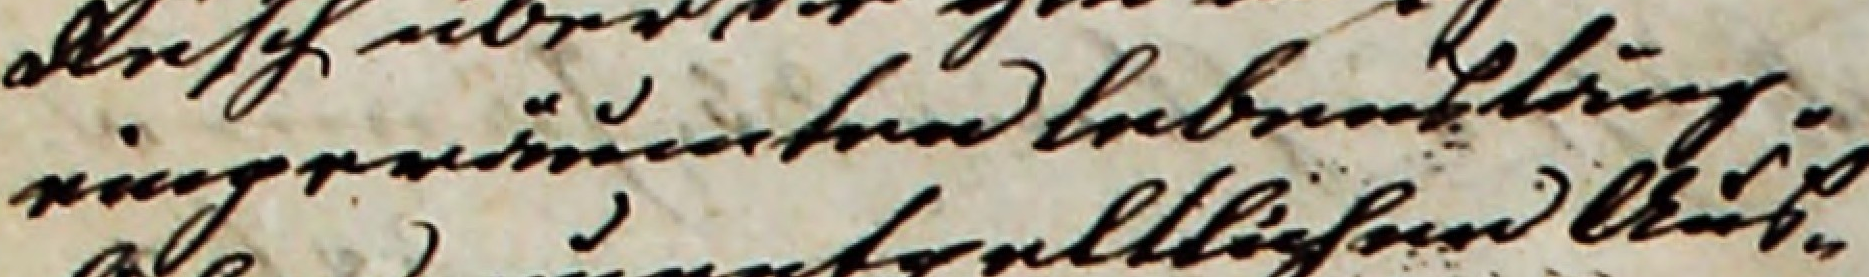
eingeräumten lebensläng„
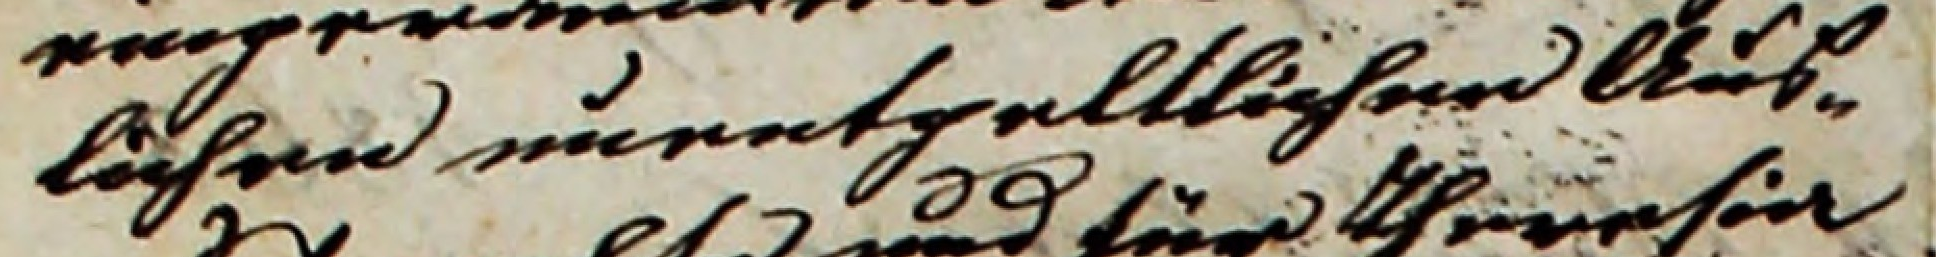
lichen unentgeltlichen Aus„
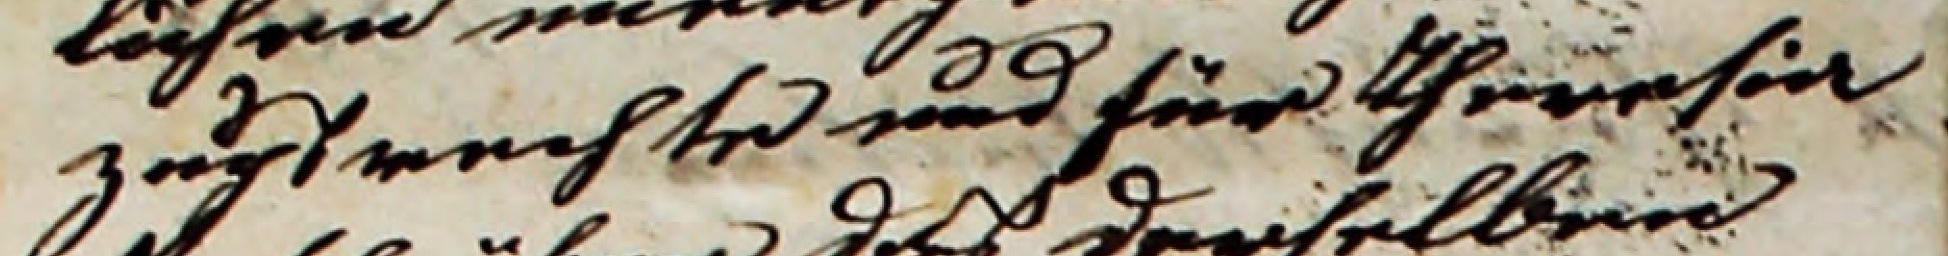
zugsrechte und für Theresia
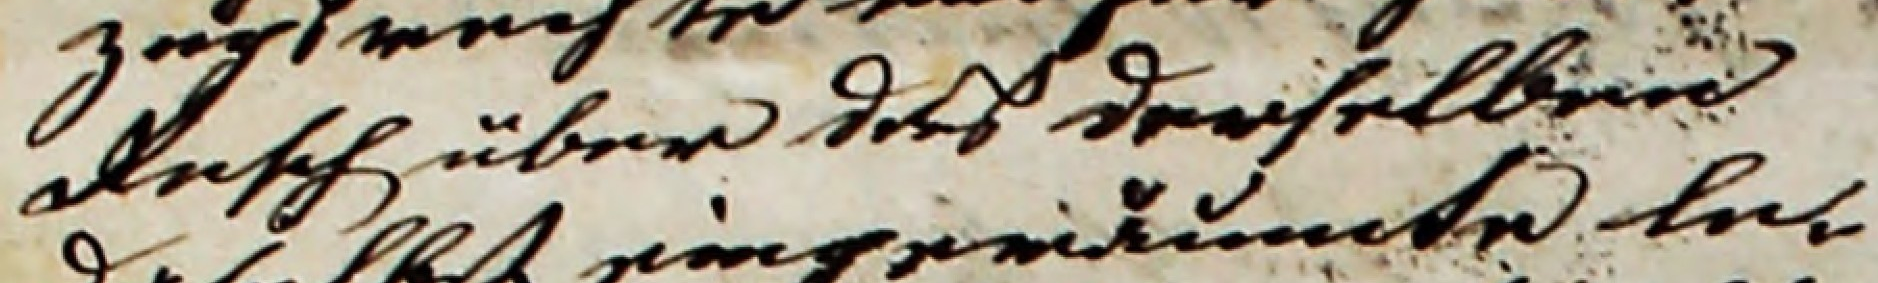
Desch über des derselben
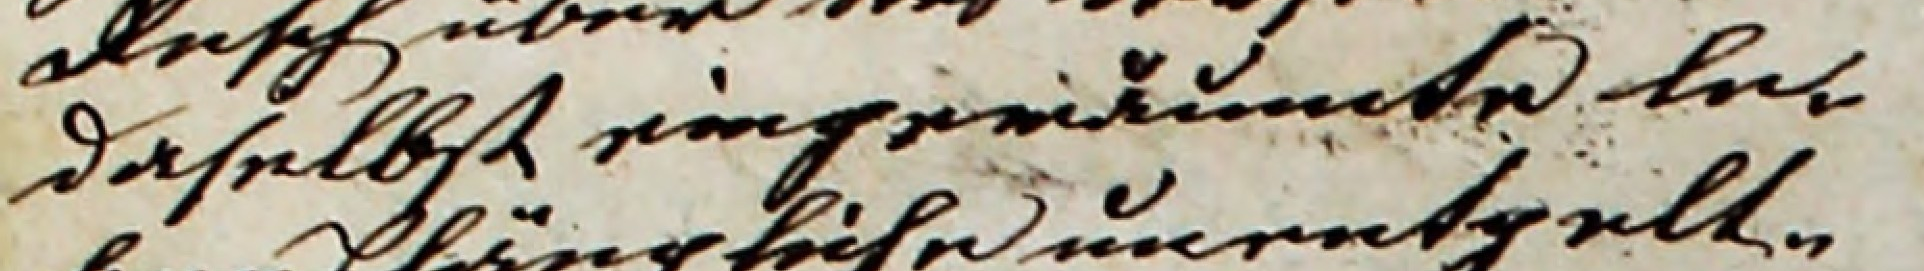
daselbst eingeräumte le„
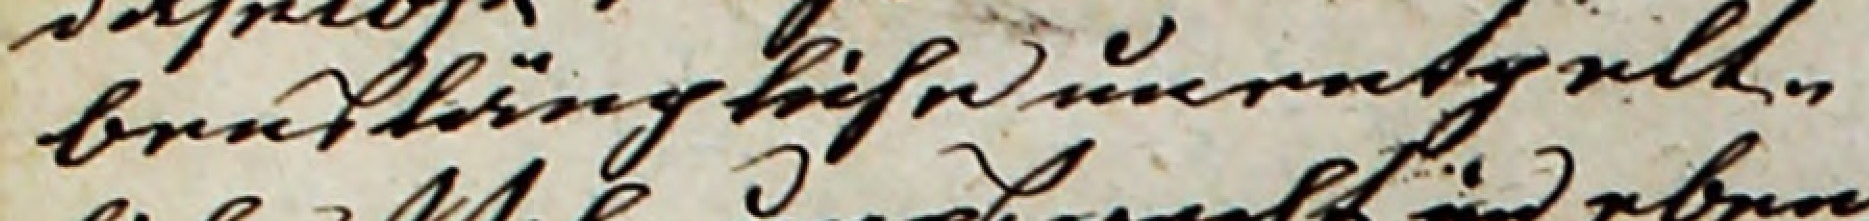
benslängliche unent„
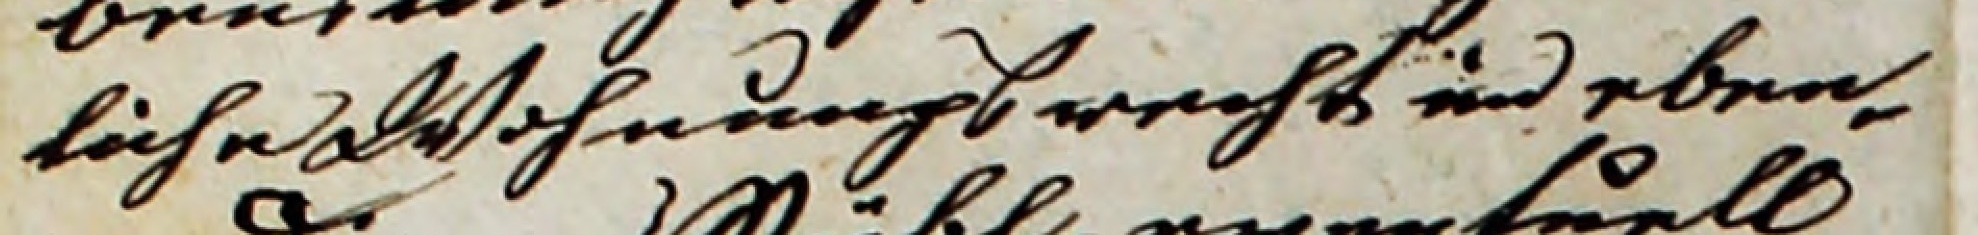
geltliche Wohnungsrecht in eben„
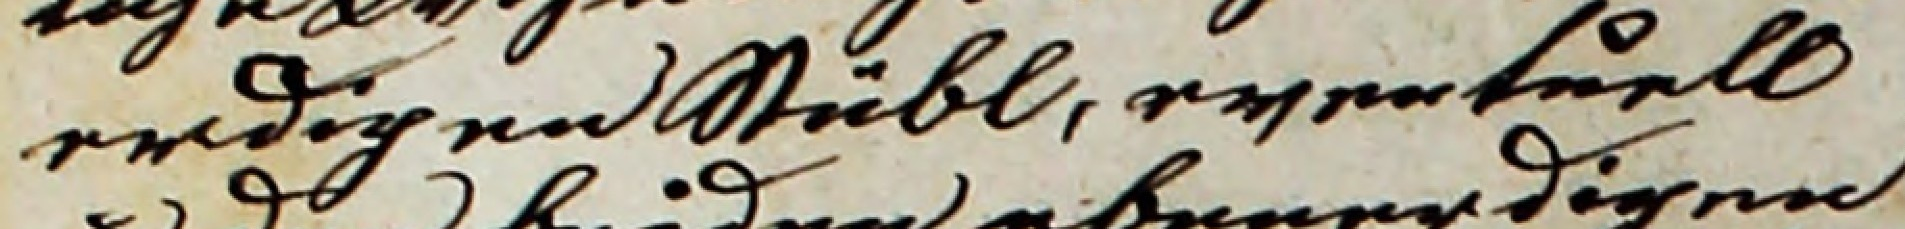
erdigen Stübl, eventuell
